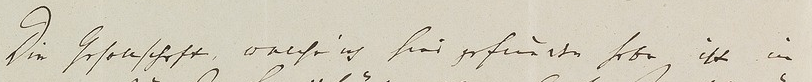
Die Gesellschaft, welche ich hier gefunden habe ist im
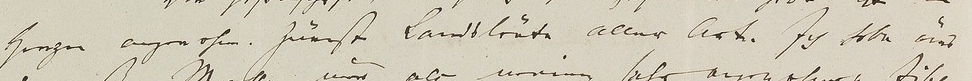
Ganzen angenehm. Zuerst Landsleute aller Art. Ich habe aus
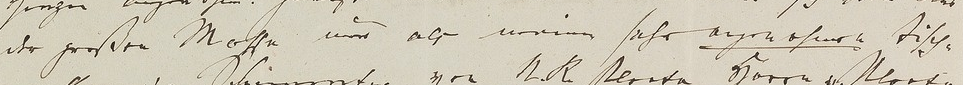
der großen Masse nun als meinen sehr angenehmen Tisch-
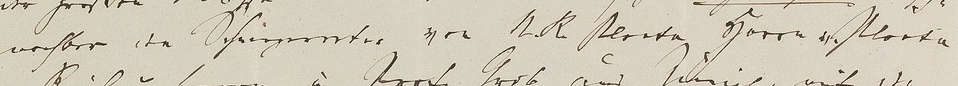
nachbar den Schwiegervater von N.R. Planta Herr v. Planta-
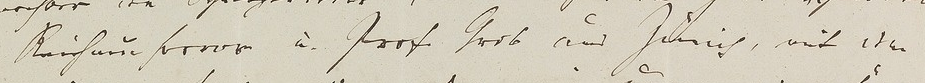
Reichenau senior u. Prof. Grob aus Zürich, mit dem
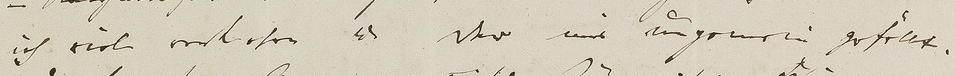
ich viel verkehre u. der mir ungemein gefällt.
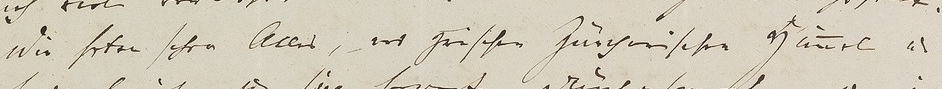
Wir haben schon Alles, was zwischen Zürcherischen Himmel u.
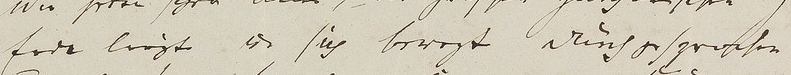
Erde liegt u. sich bewegt durchgesprochen
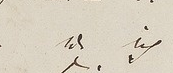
u. ich
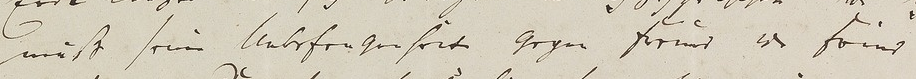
muß seine Unbefangenheit gegen Freund u. Feind
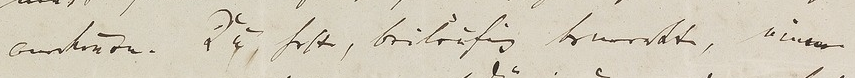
anerkennen. Du hast, beiläufig bemerkt, eine
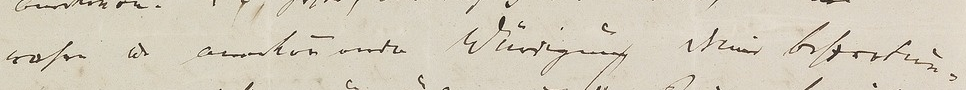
wahre u. anerkennende Würdigung deiner Bestrebun-
